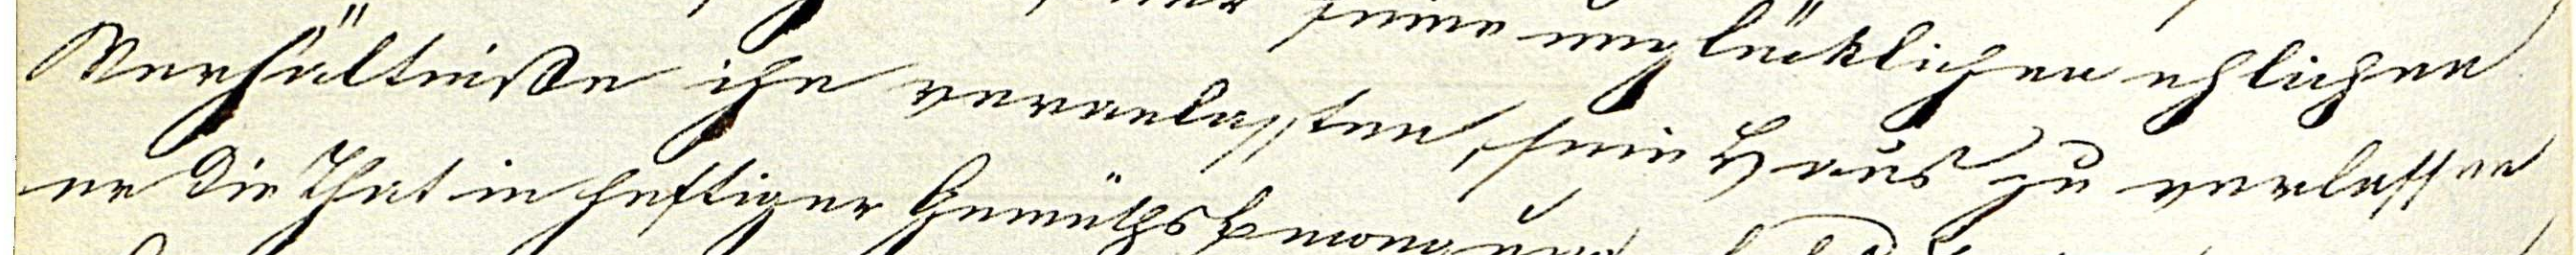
Verhältniße ihn veranlassten, sein Haus zu verlassen
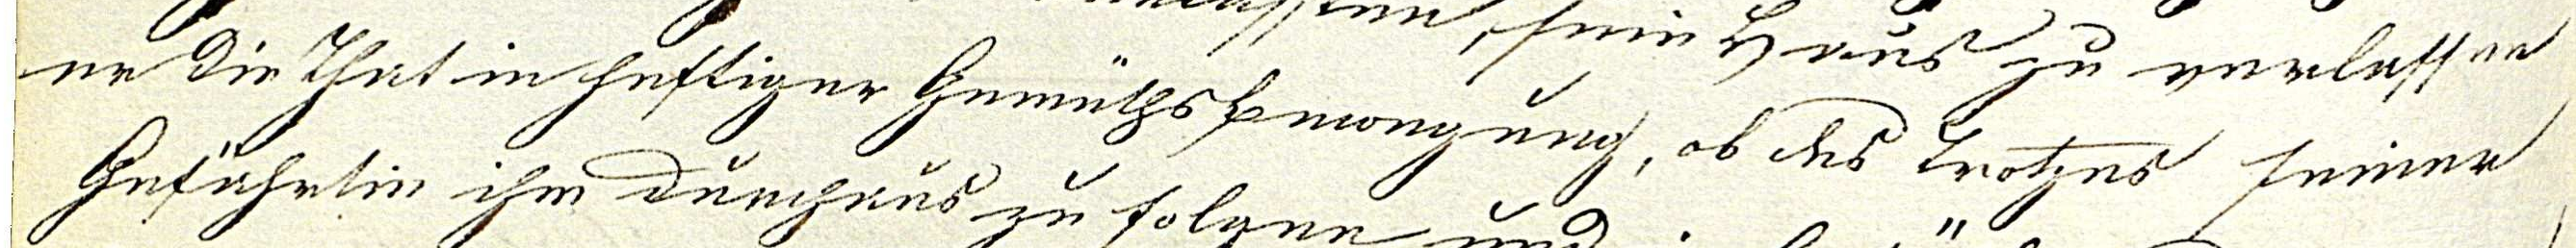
er die That in heftiger Gemüthsbewegung, ob des trotzes seiner
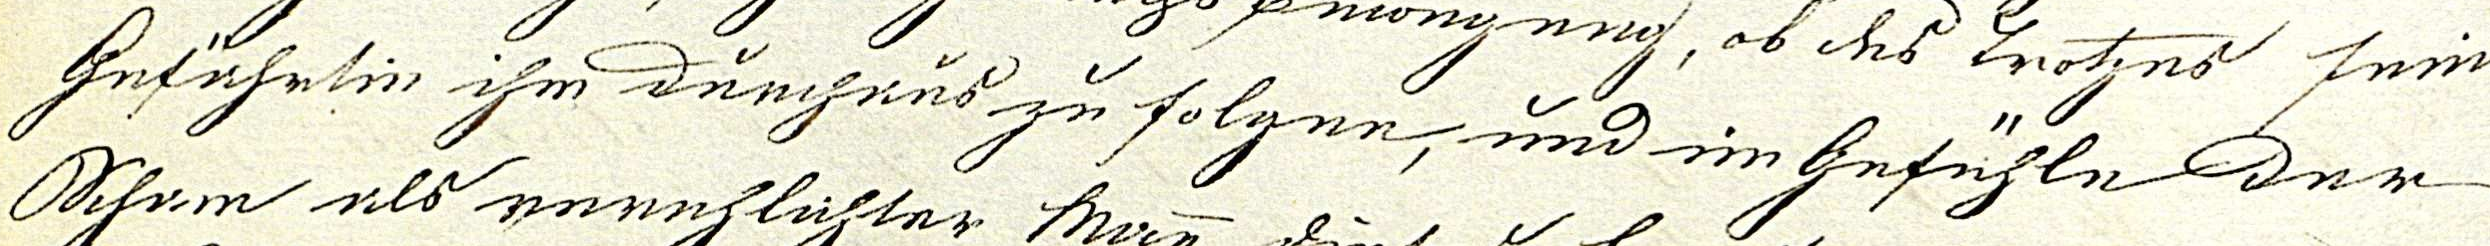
Gefährtin ihm durchaus zu folgen, und im Gefühle der
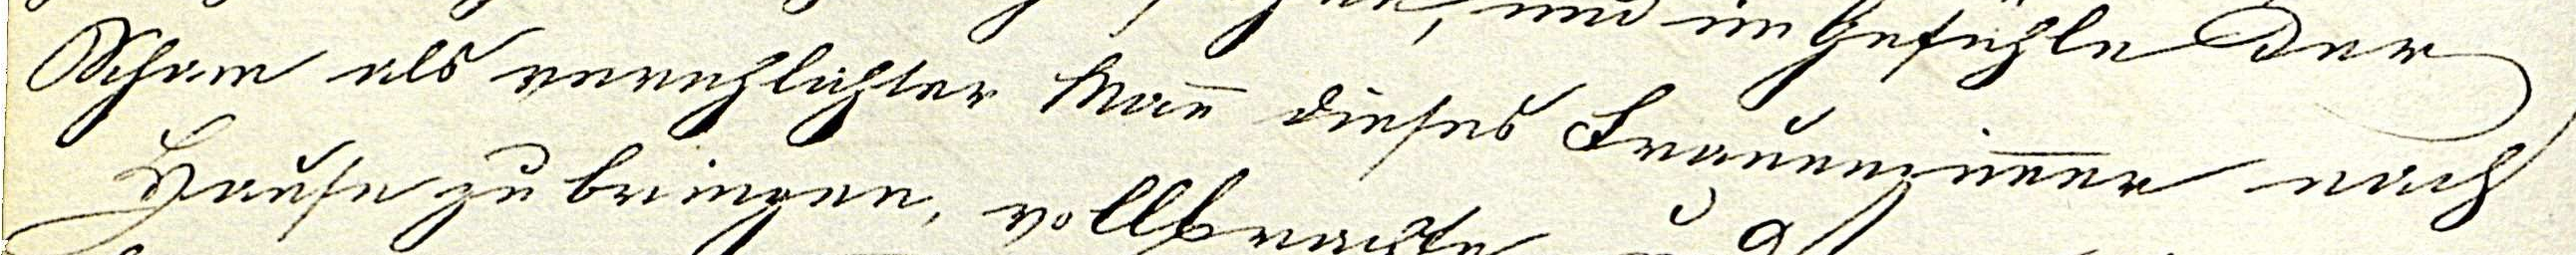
Scham als verehlichter Mann dieses Frauenzimmer nach
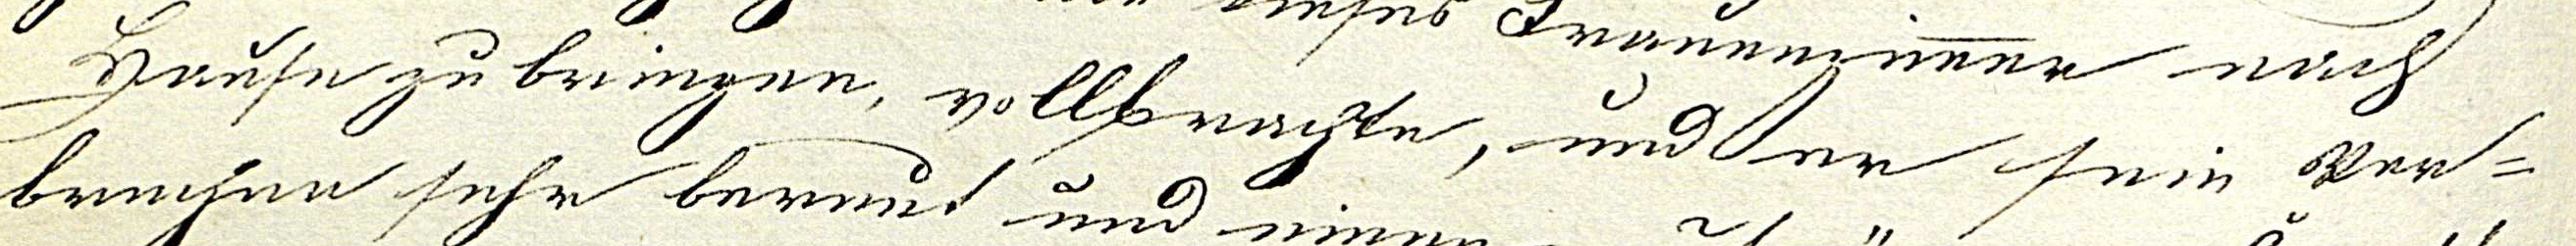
Hause zu bringen, vollbrachte, und er sein Ver¬
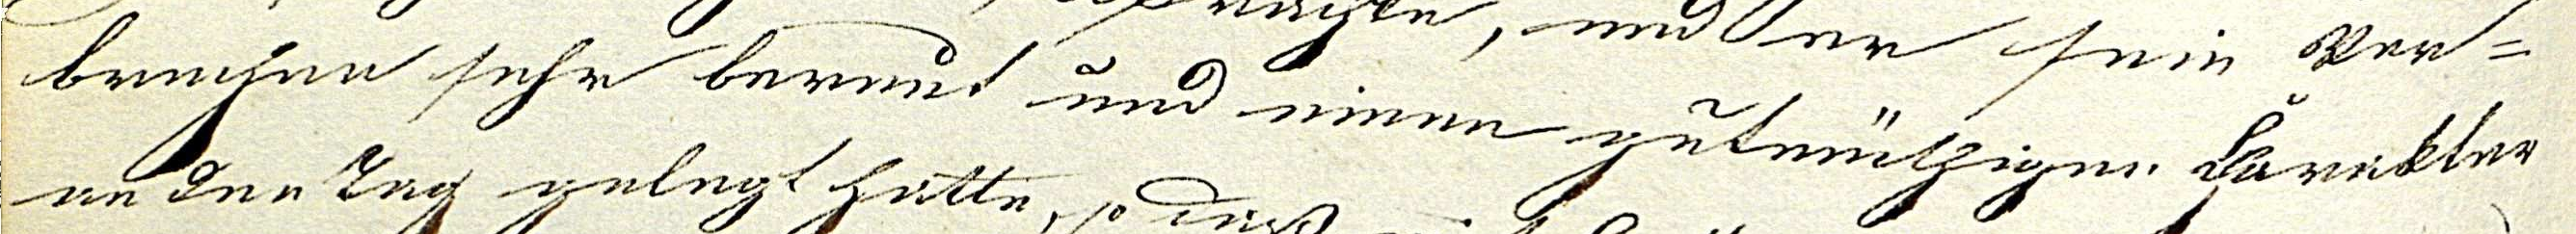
brechen sehr bereut und einen gutmüthigen Charakter
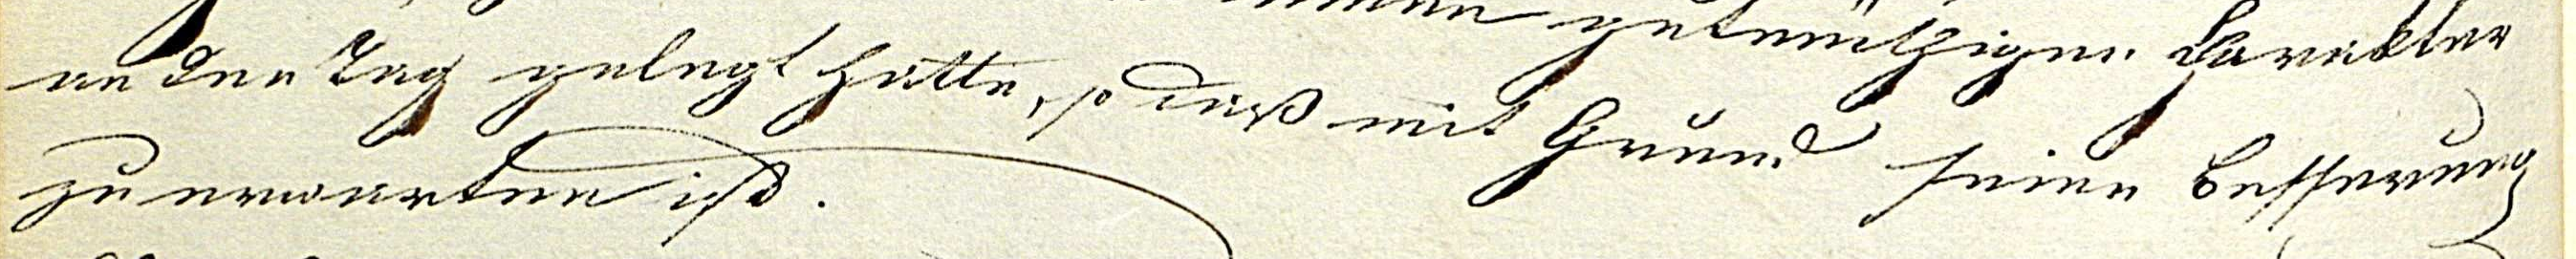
an den Tag gelegt hatte, so daß mit Grund seine Besserung
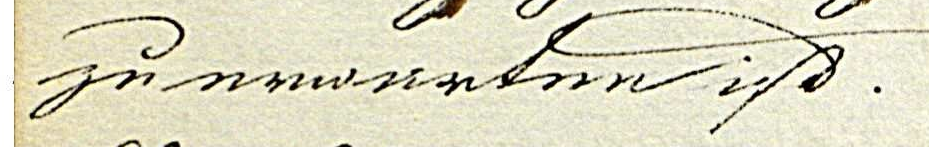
zu erwarten ist.
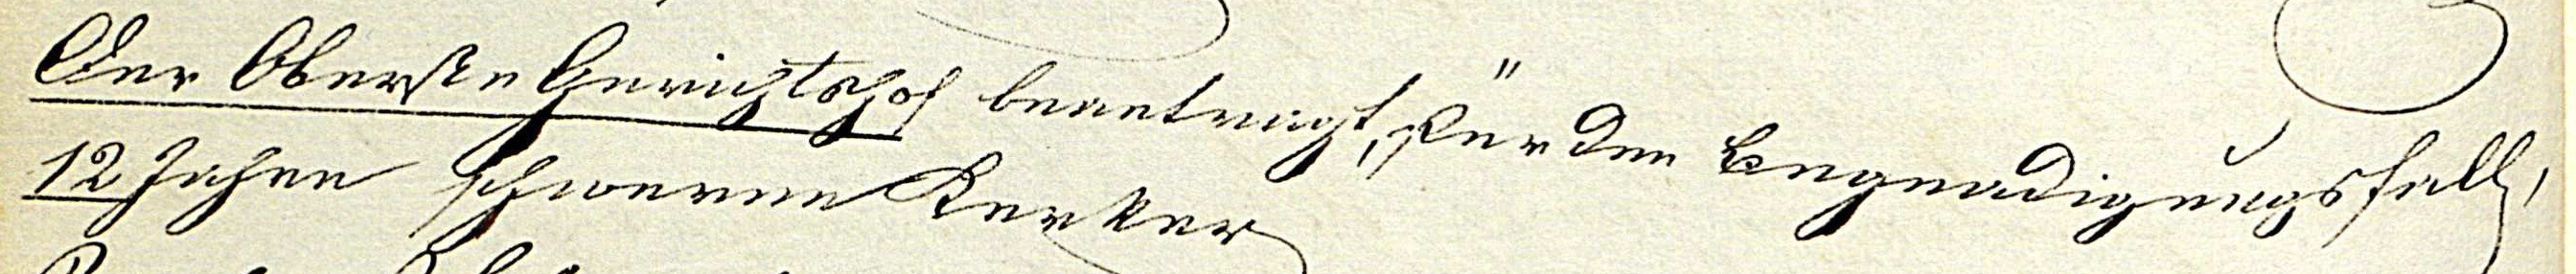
Der Oberste Gerichthsof beantragt, für den Begandigungsfall,
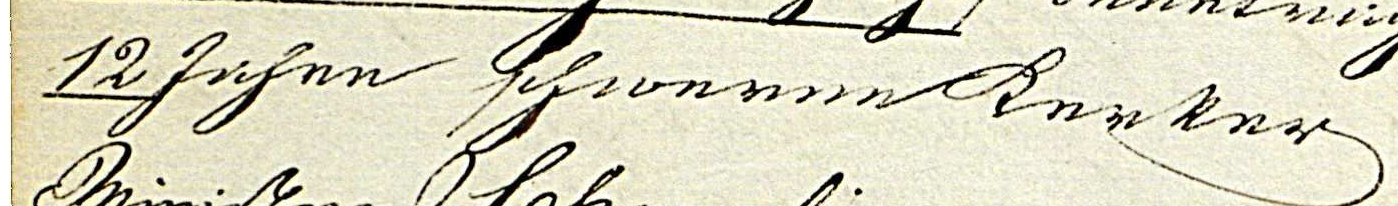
12 Jahre schweren Kerker.
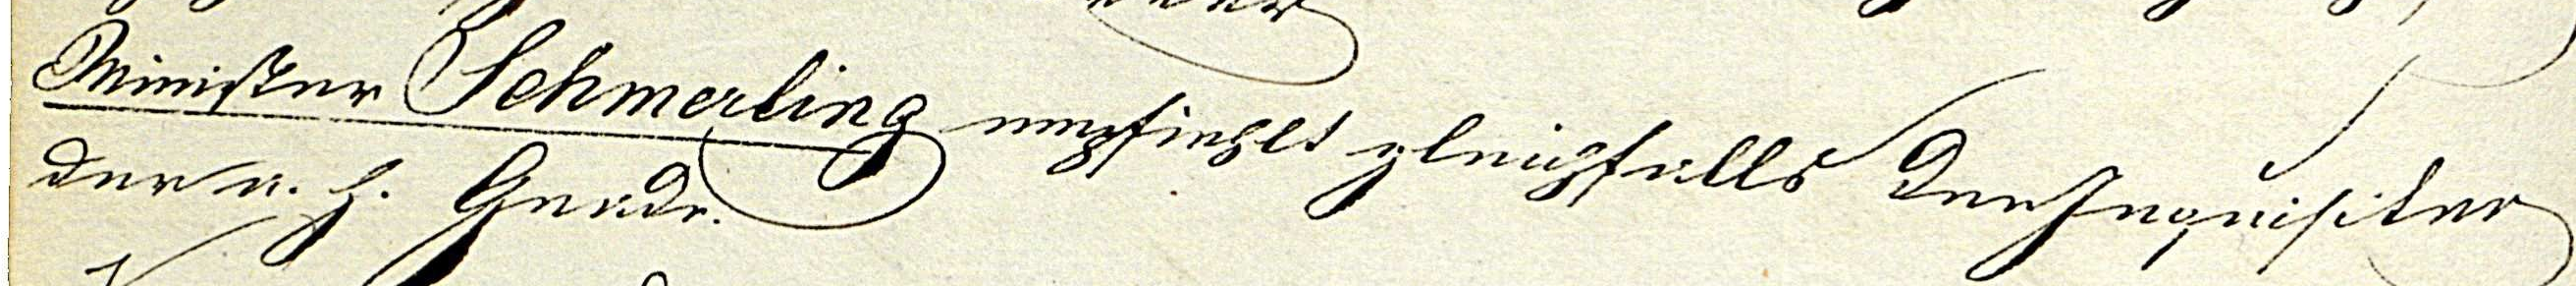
Minister Schmerling empfiehlt gleichfalls den Inquisit der
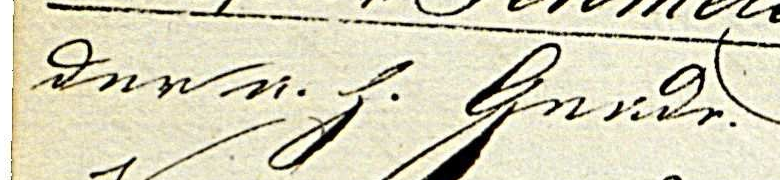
der a.h. Gnade
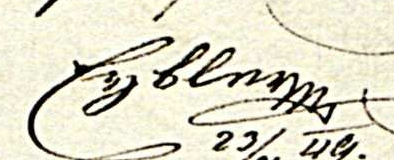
Eybler
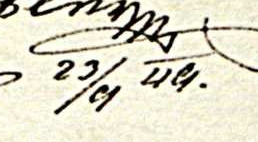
23/9 49
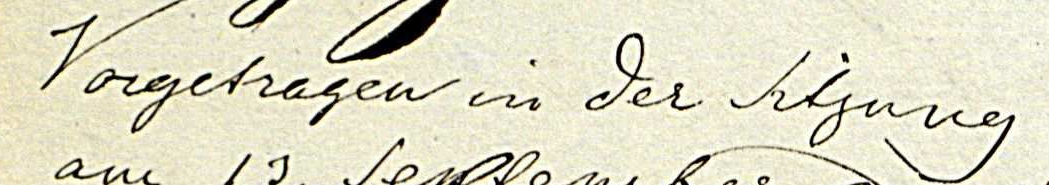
Vorgetragen in der Sitzung
